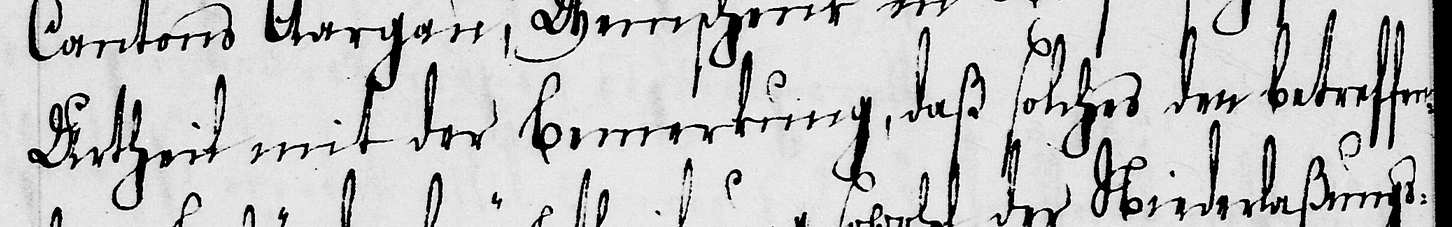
Urtheil mit der Bemerkung, daß solches den betref¬
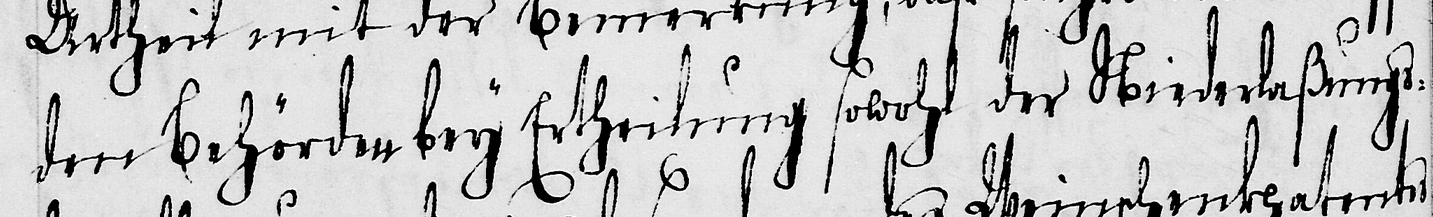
nden Behörden bey Ertheilung sowohl der Niederlaßungs¬
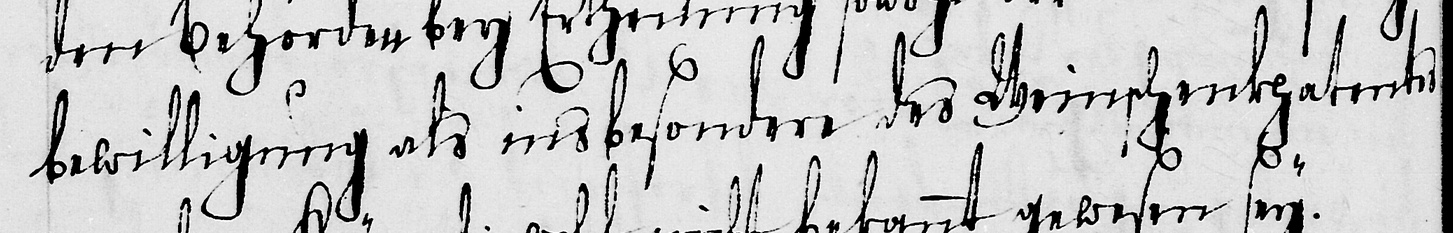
bewilligung als insbesondere des Weinschenkpatentes
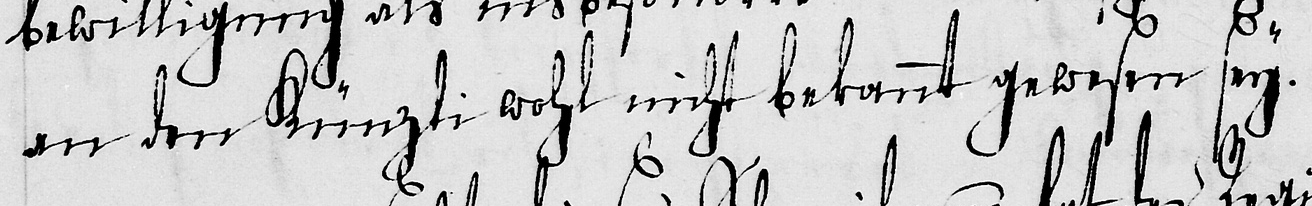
an den Künzli wohl nicht bekannt gewesen sey.
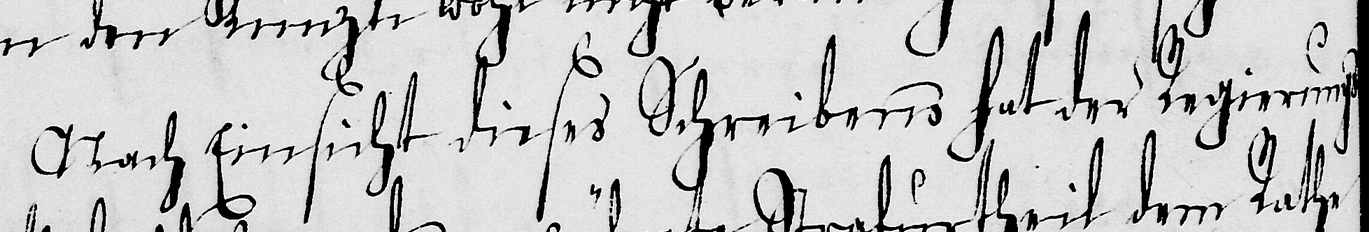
Nach Einsicht dieses Schreibens hat der Regierun¬
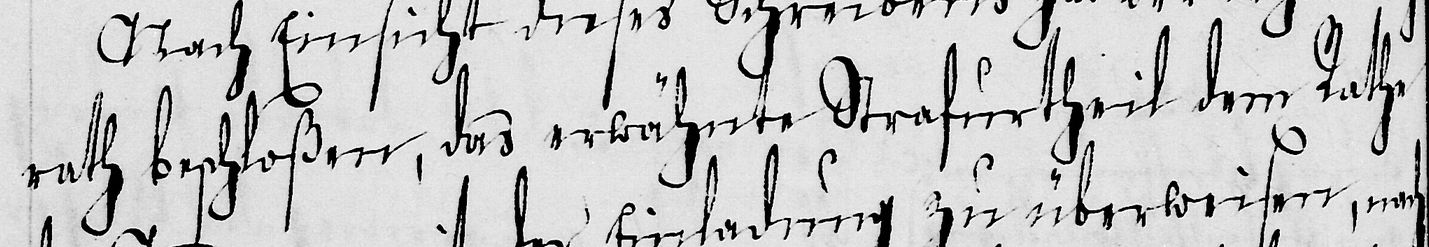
rath beschloßen, das erwähnte Strafurtheil dem Rathe
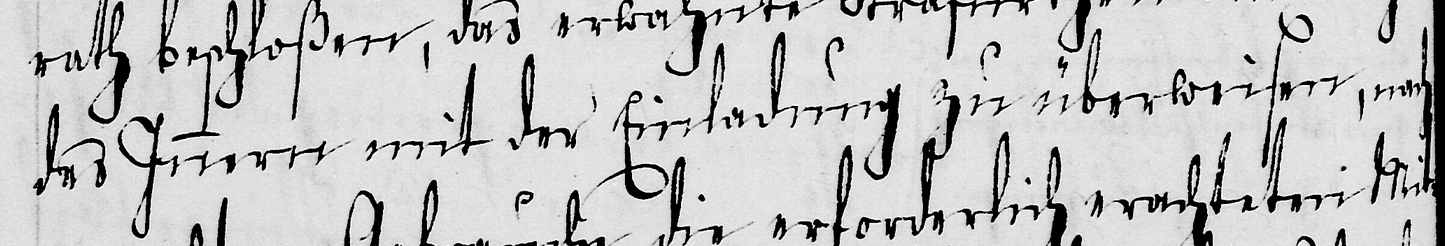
des Innern mit der Einladung zu überweisen, na¬
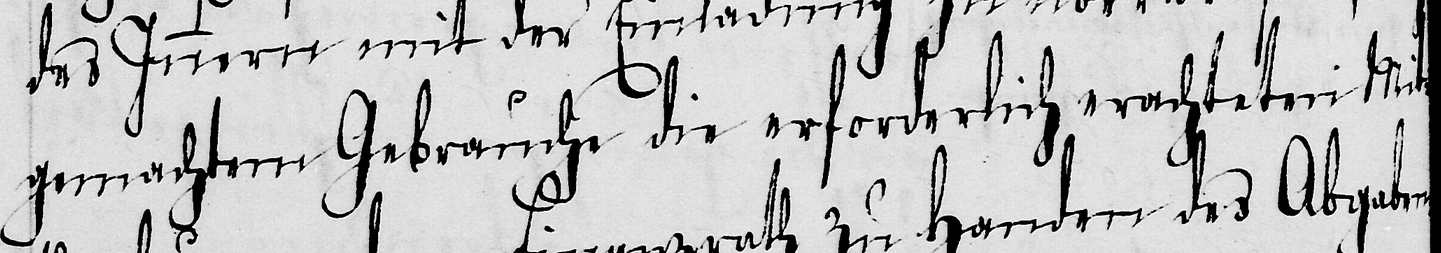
gemachtem Gebrauche die erforderlich erachteten Mi¬
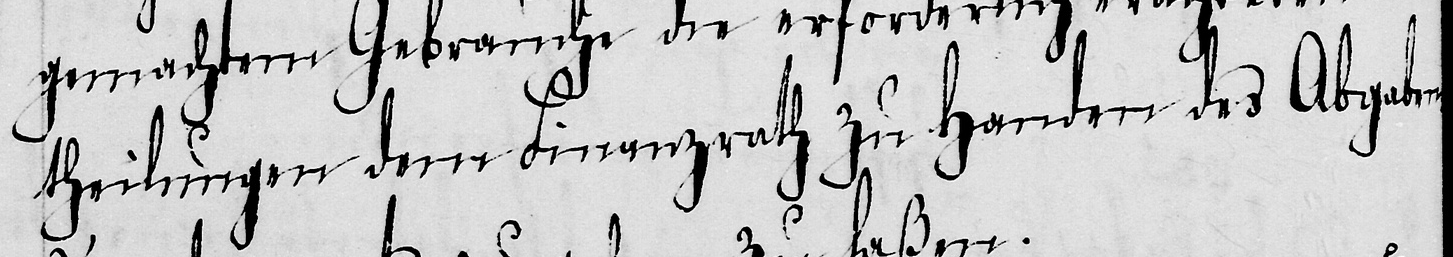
theilungen dem Finanzrath zu Handen des Abgab¬
